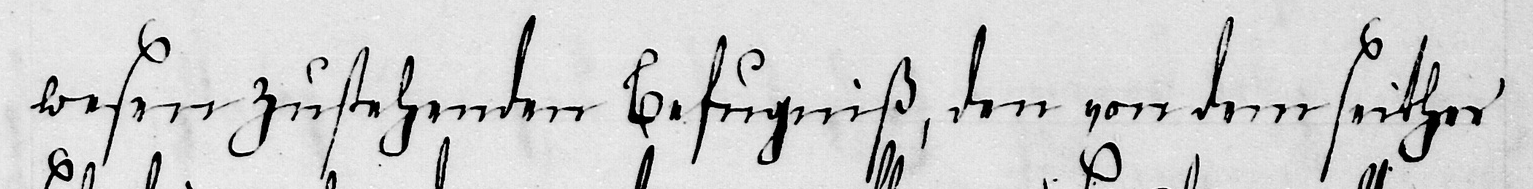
wesen zustehenden Befugniß, den von dem seither
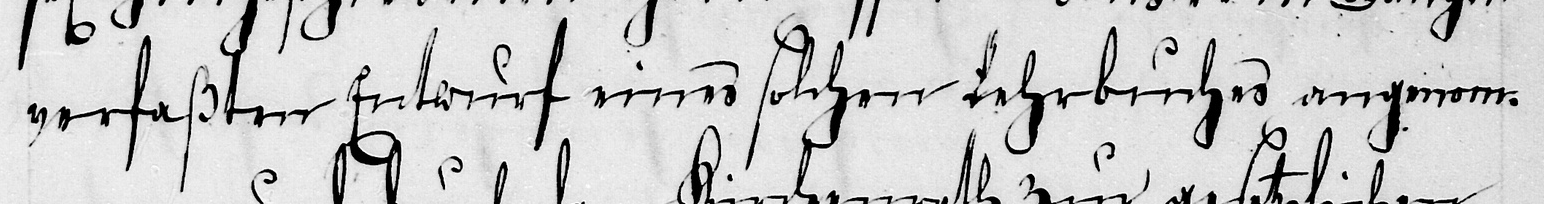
verfaßten Entwurf eines solchen Lehrbuches angenom¬
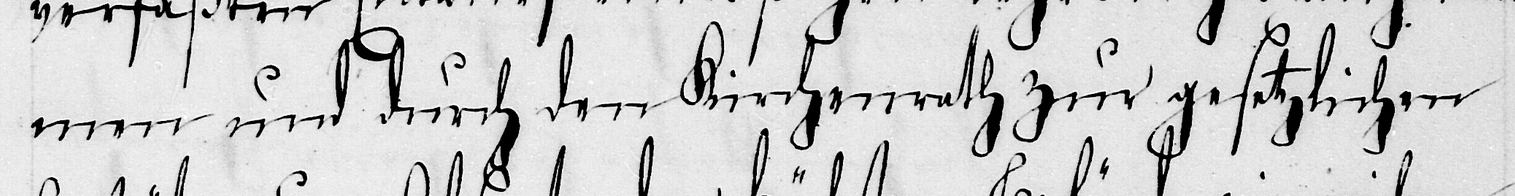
men und durch den Kirchenrath zur gesetzlichen
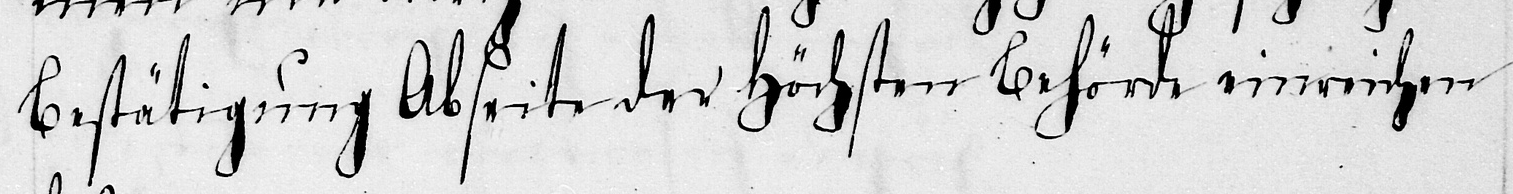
Bestätigung Abseite der Höchsten Behörde einreichen
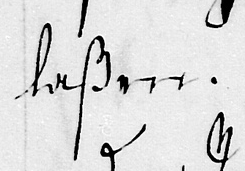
laßen.
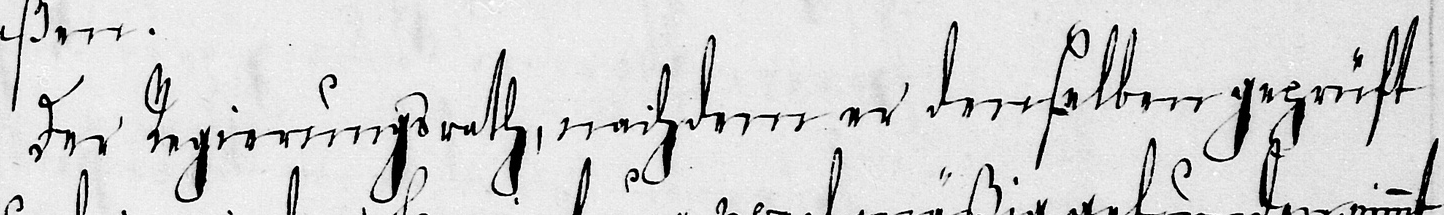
Der Regierungsrath, nachdem er denselben geprüft
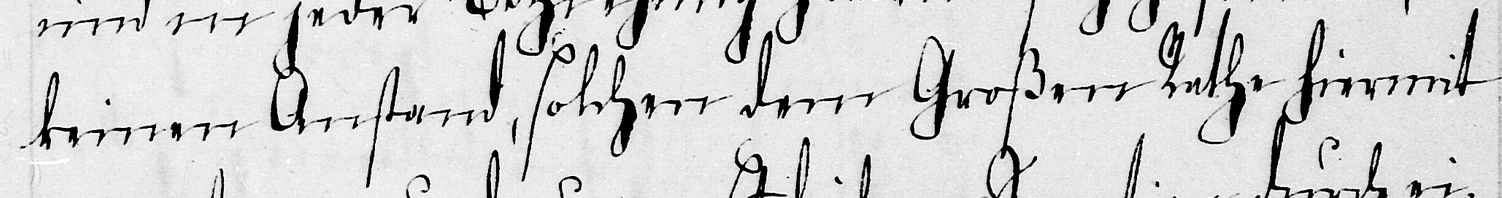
keinen Anstand, solchen dem Großen Rathe hiermit
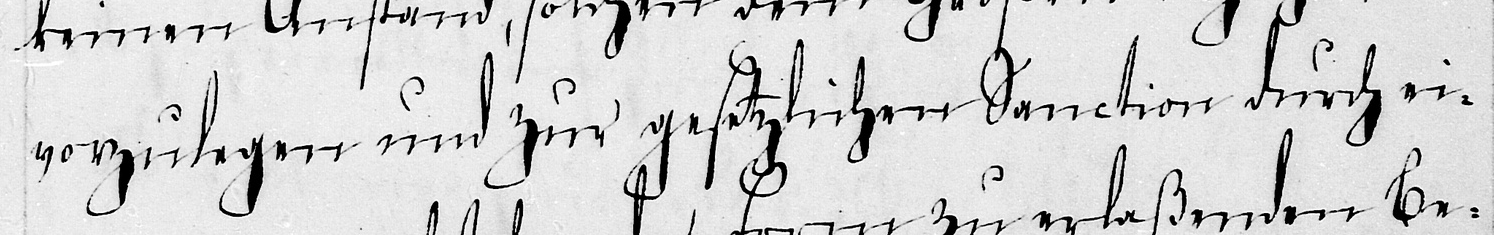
vorzulegen und zur gesetzlichen Sanction durch ei¬
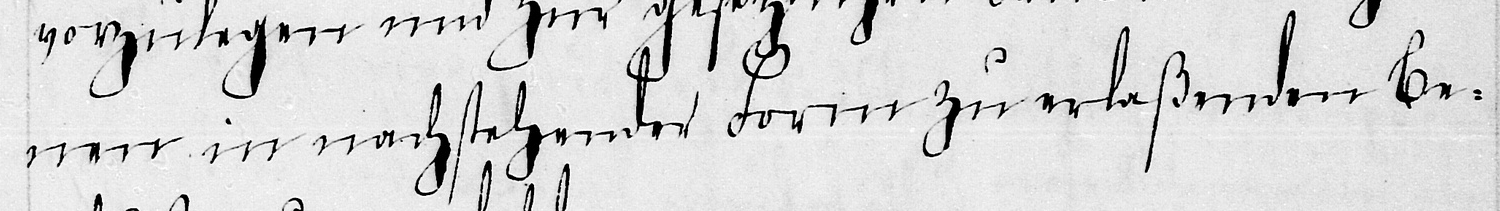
nen in nachstehender Form zu erlaßenden Be¬
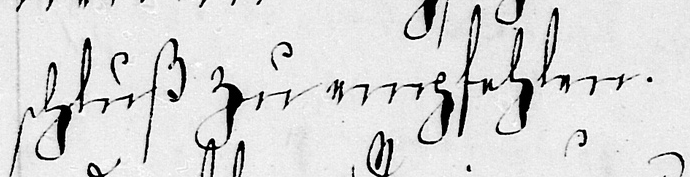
schluß zu empfehlen.
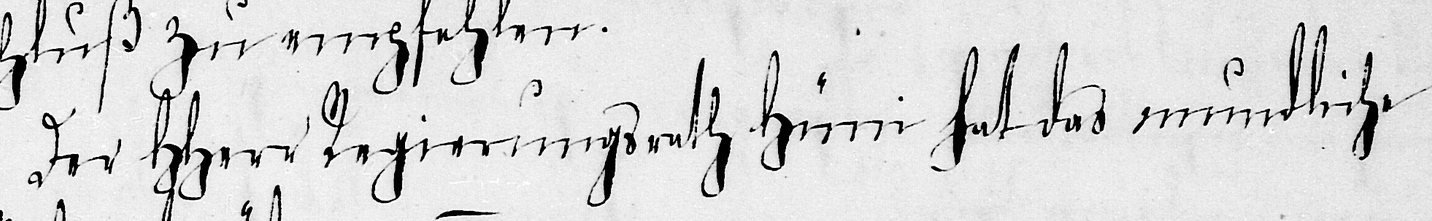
Der HHerr Regierungsrath Hüni hat das mündliche
